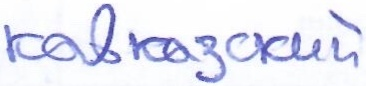кавказский
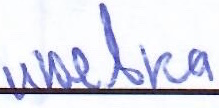люевка
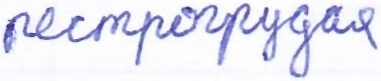пестрогрудая
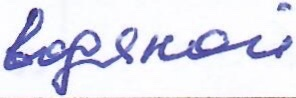водяной
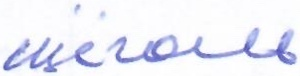щёголь
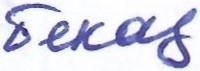беказ
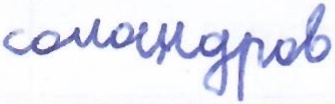соландров
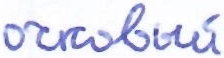очковый
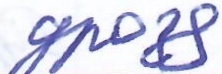дрозд
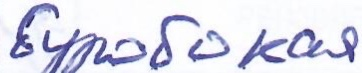буробокая
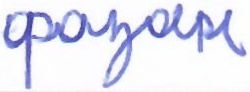фазан
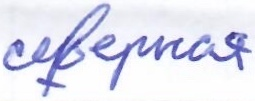северная
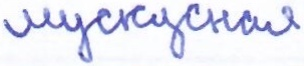мускусная
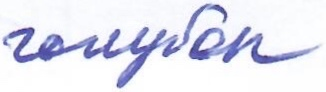голубок
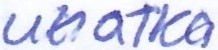ипатка
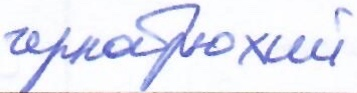чернобрюхий
